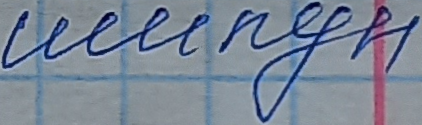шипун
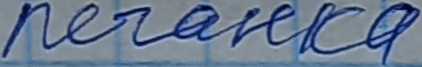пеганка
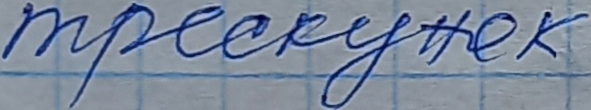трескунок
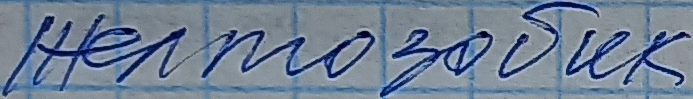желтозобик
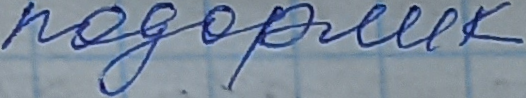подорлик
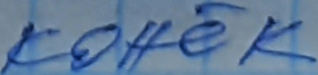конёк
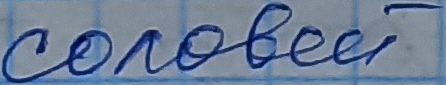соловей
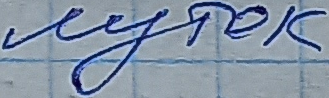луток
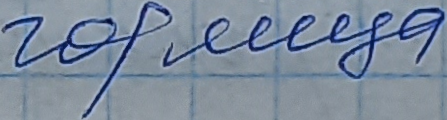горлица
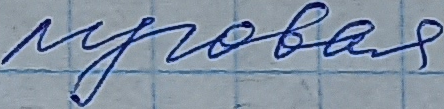луговая
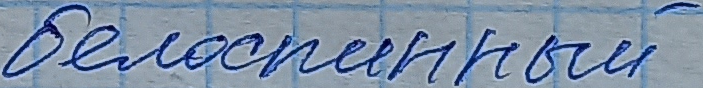белоспинный
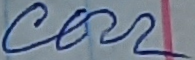сыч
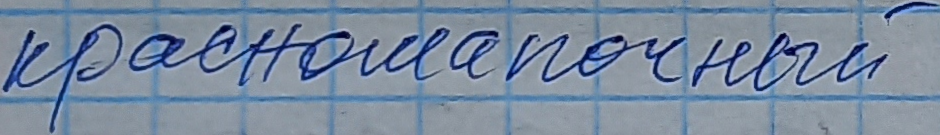красношапочный
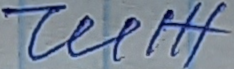чиж
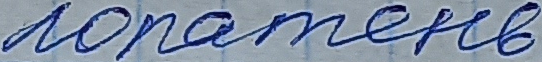лопатень
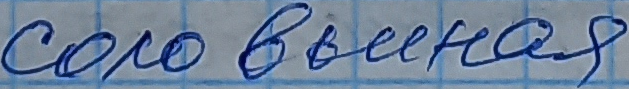соловьиная
